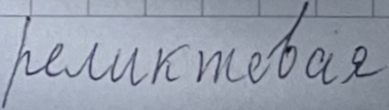реликтовая
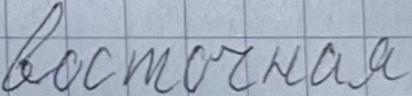восточная
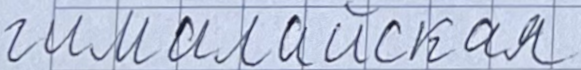гималайская
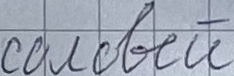соловей
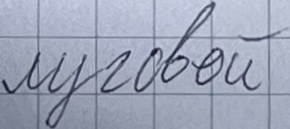луговой
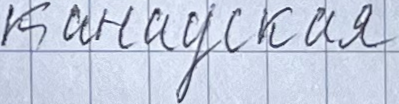канадская
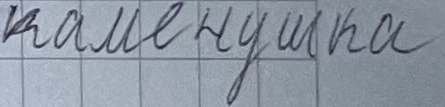каменушка
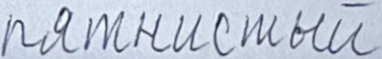пятнистый
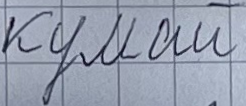кумай
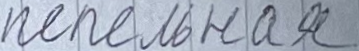пепельная
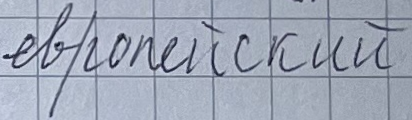европейский
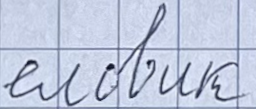еловик
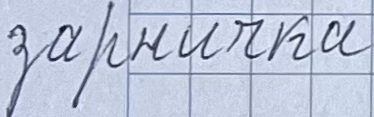зарничка
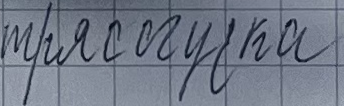трясогузка
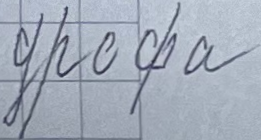дрофа
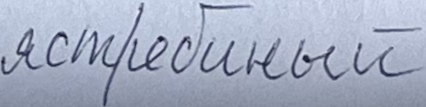ястребиный
